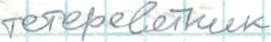тетеревятник
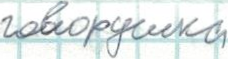говорушка
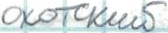охотский
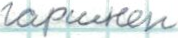гаршнеп
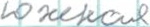южная
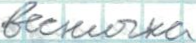весничка
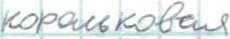корольковая
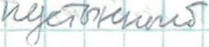пустынный
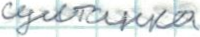султанка
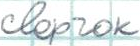сверчок
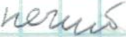пегий
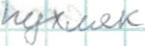пухляк
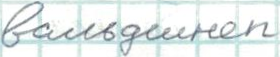вальдшнеп
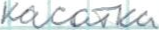касатка
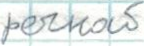речной
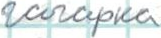гагарка
